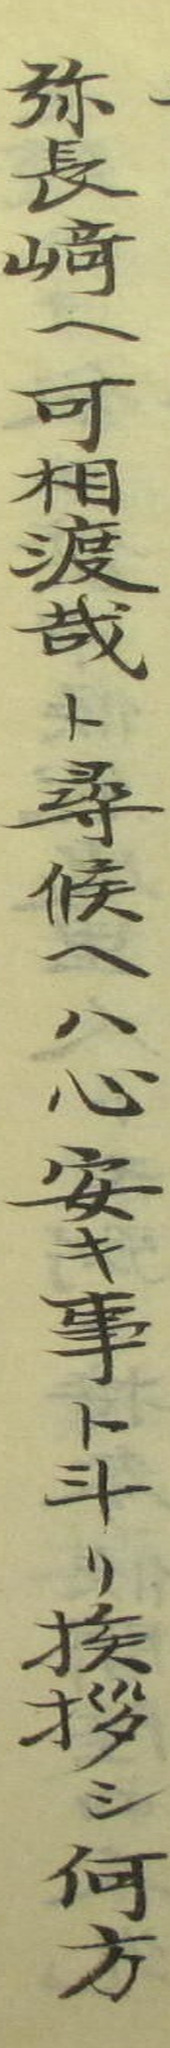弥長﨑ヘ可相渡哉ト尋候ヘハ心安キ事ト斗リ挨拶シ何方
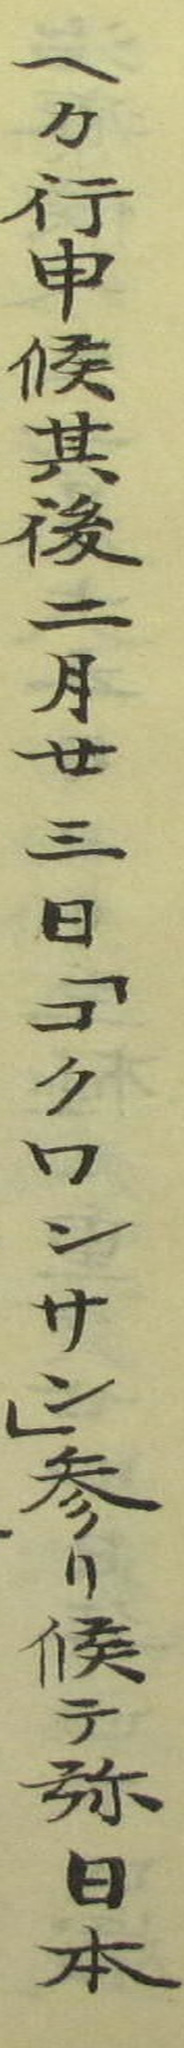ヘカ行申候其後二月廿三日「コクワンサン」参リ候テ弥日本
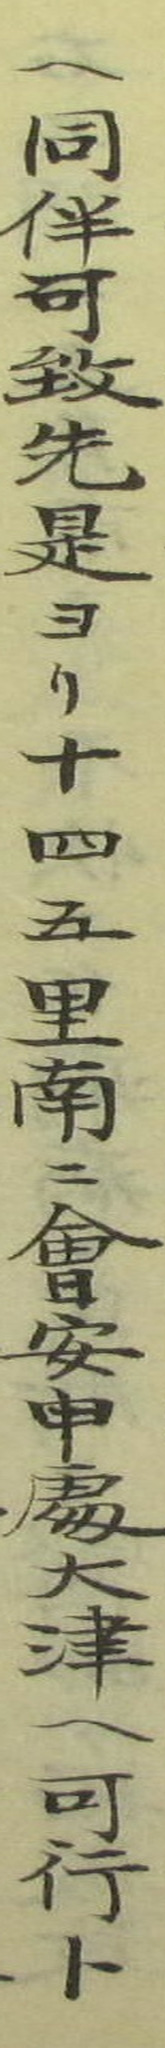ヘ同伴可致先是ヨリ十四五里南ニ會安申處大津ヘ可行ト
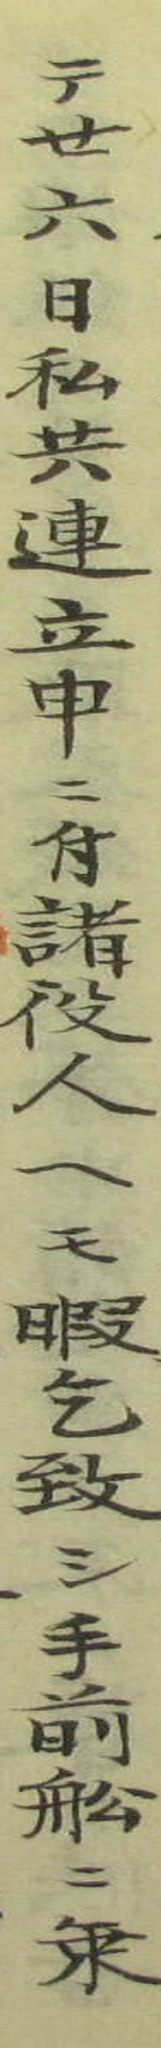テ廿六日私共連立申二付諸役人ヘモ暇乞致シ手前舩ニ乗
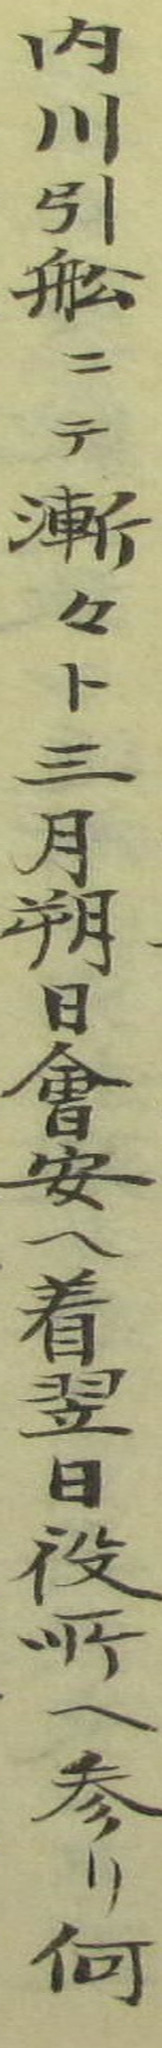内川引舩ニテ漸々ト三月朔日會安ヘ着翌日役所ヘ参リ何
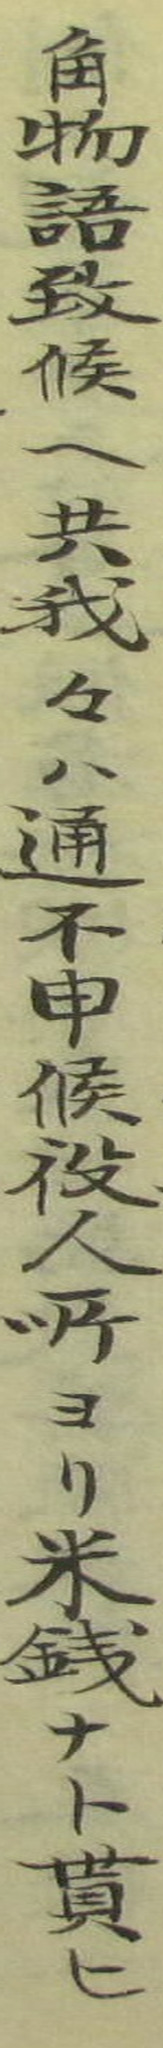角物語致候ヘ共我々ハ通不申候役人所ヨリ米銭ナト貰ヒ
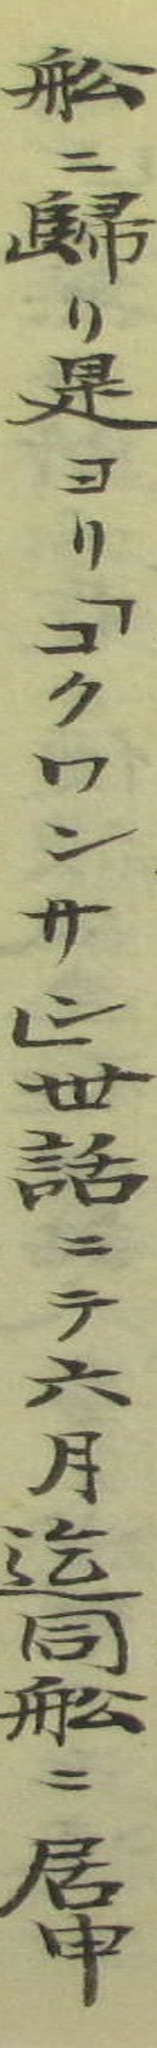舩ニ帰リ是ヨリ「コクワンサン」世話ニテ六月迄同舩ニ居申
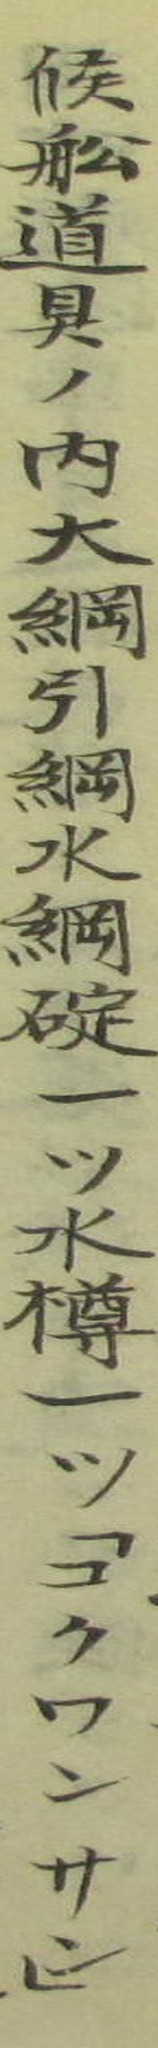候舩道具ノ内大綱引綱水綱碇一ツ水樽一ツ「コクワンサン」
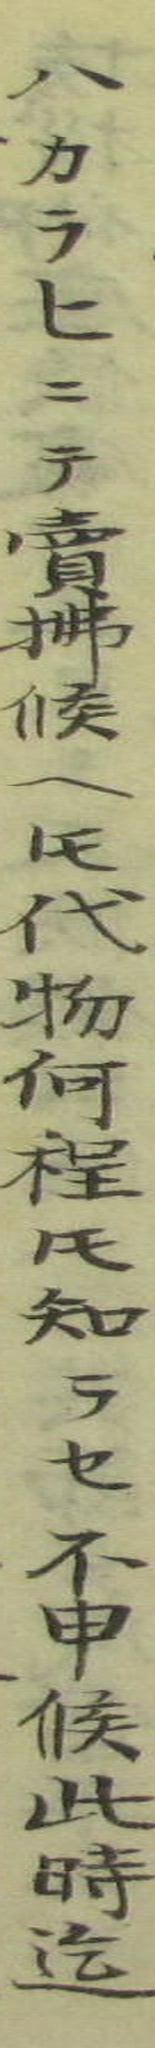ハカラヒニテ賣拂候ヘ供代物何程供知ラセ不申候此時迄
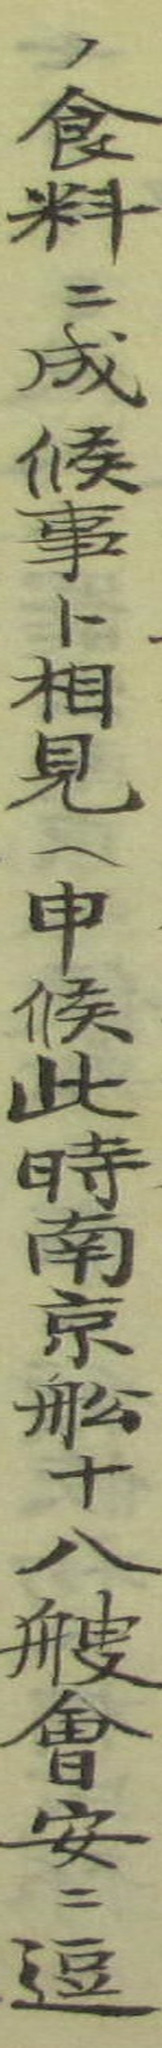ノ食料ニ成候事ト相見ヘ申候此時南京舩十八艘會安ニ逗
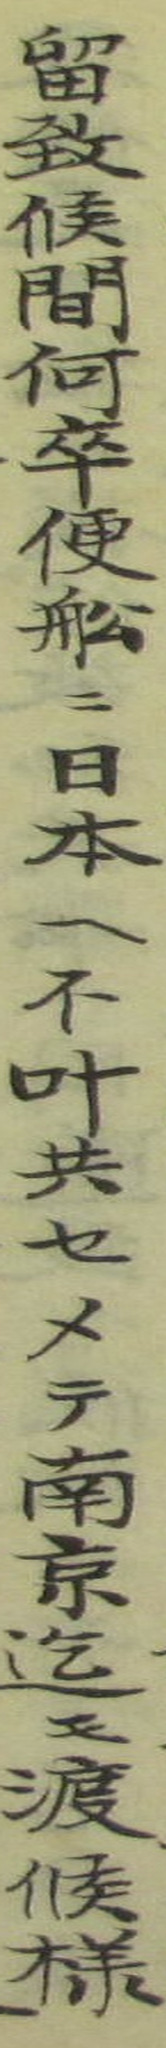留致候間何卒便舩ニ日本ヘ不叶共セメテ南京迄モ渡候様
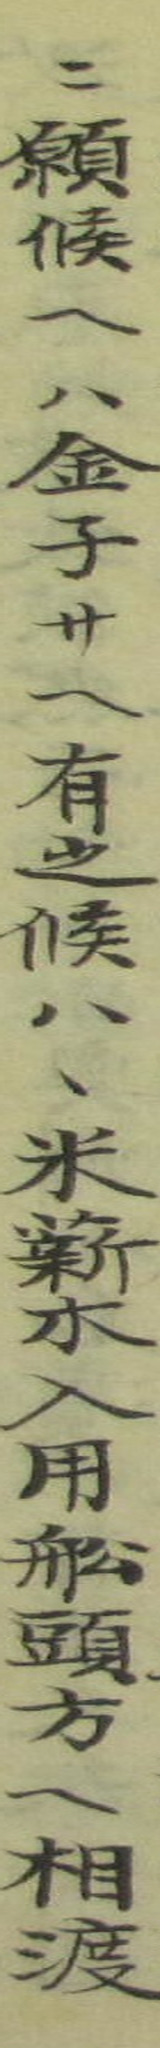ニ願候ヘハ金子サヘ有之候ハヽ米薪木入用舩頭方ヘ相渡
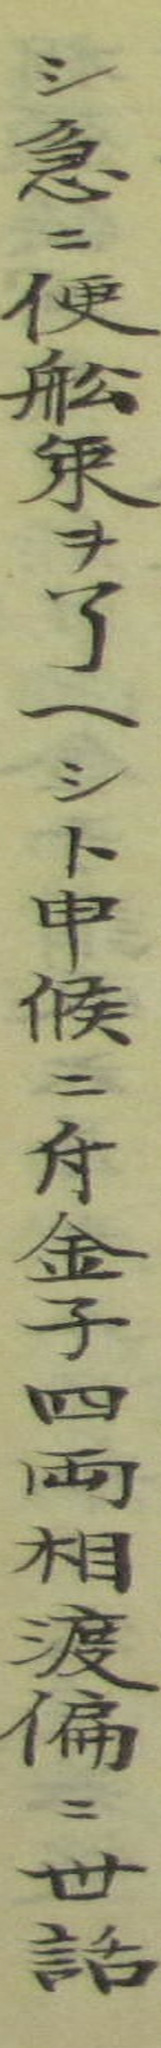シ急ニ便舩乗ヲ了へシト申候ニ付金子四両相渡偏ニ世話

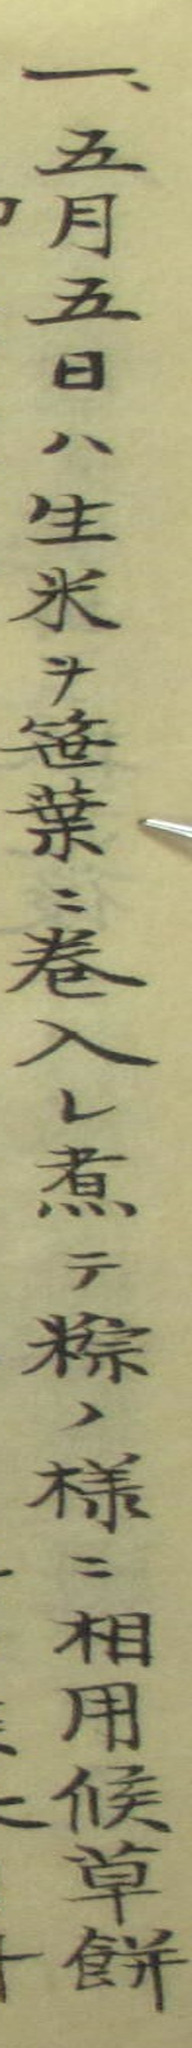一五月五日ハ生米ヲ笹葉ニ巻入レ煮テ粽ノ様ニ相用候草餅
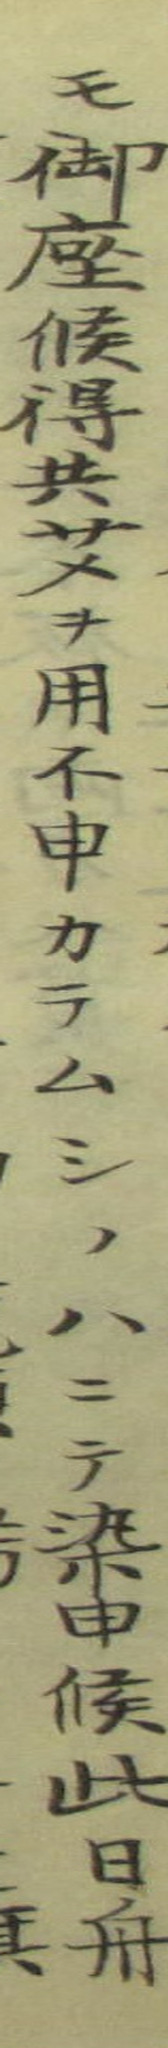モ御座候得共艾ヲ用不申カラムシノハニテ染申候此日舟
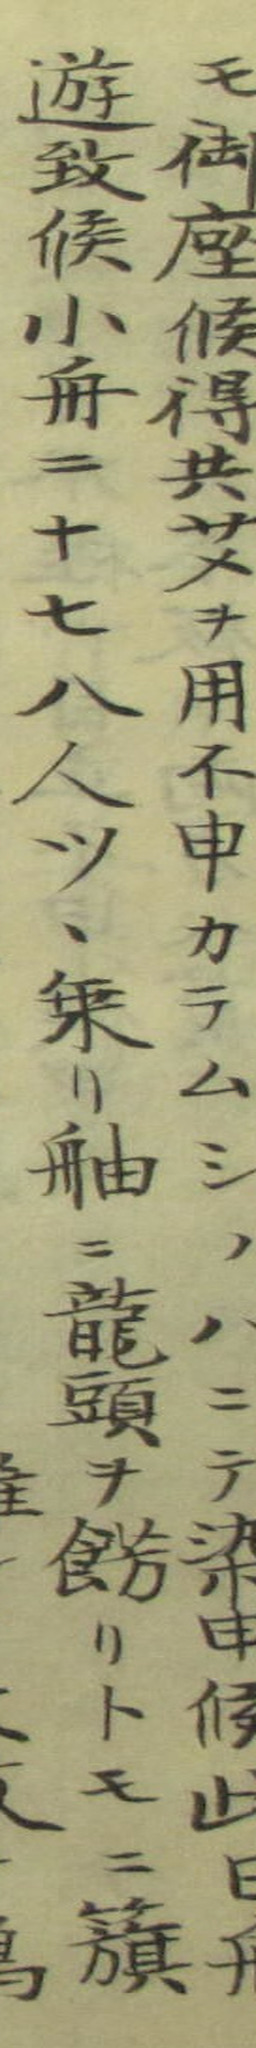遊致候小舟二十七八人ツヽ乗リ舳ニ龍頭ヲ餝リトモニ籏
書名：異国船漂着記 外二
